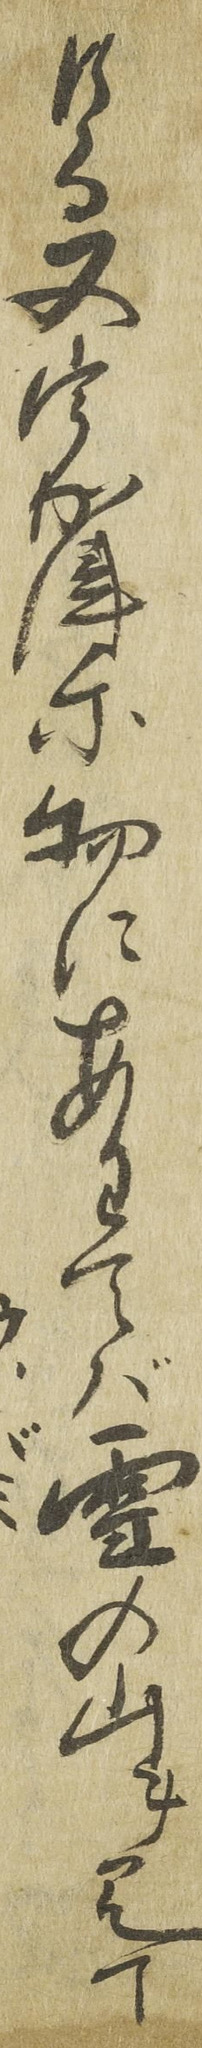ける又うかつに物にあわてば雪の山ヲ見て
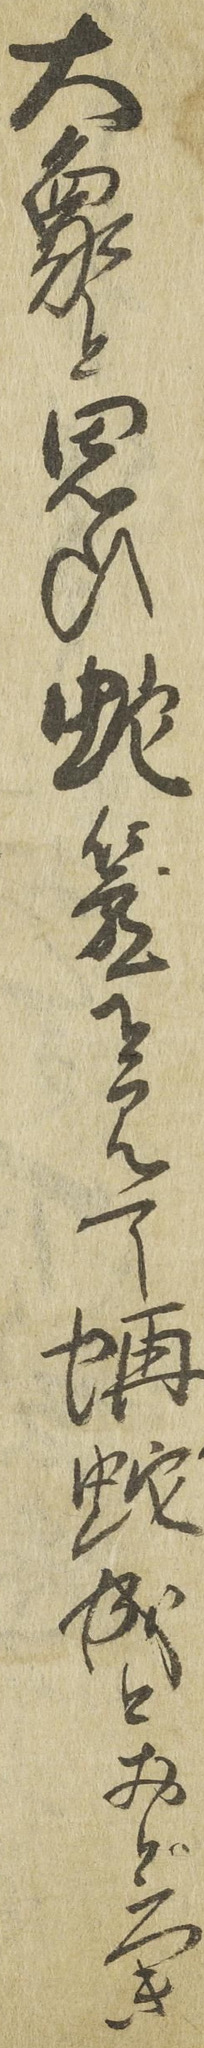大象と思ひ蛇籠を見て蟒蛇成とおどろき
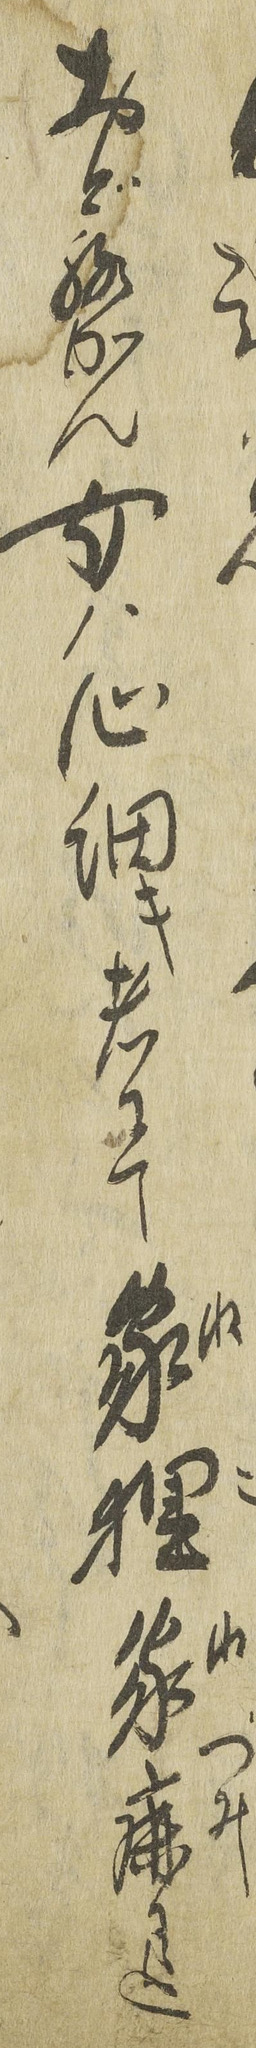おどろかん女は心細キ者にて家狸家鹿迄
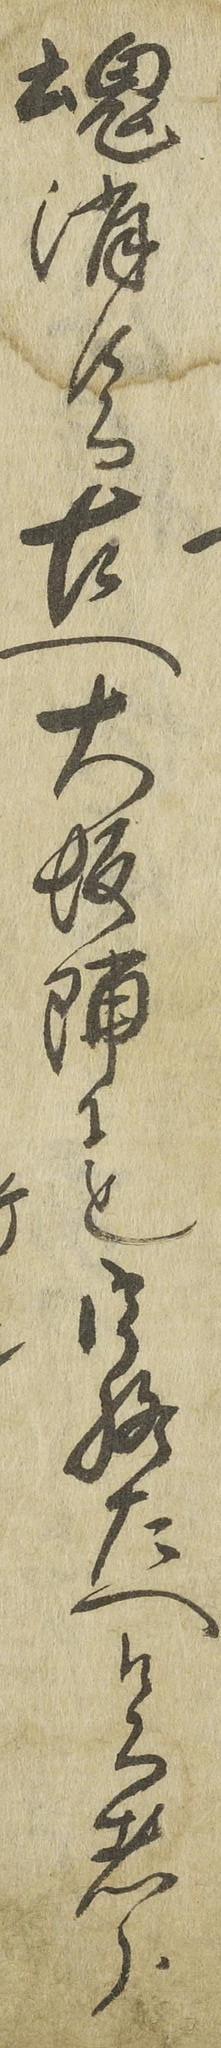魂消ける古へ大坂陣にもうろたへける者ら
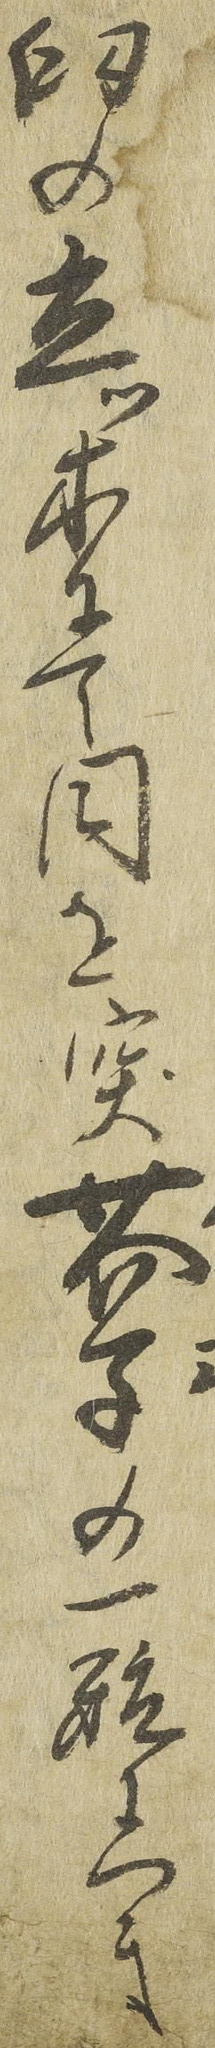的の立ツ木にて目を突芥子の一粒につま
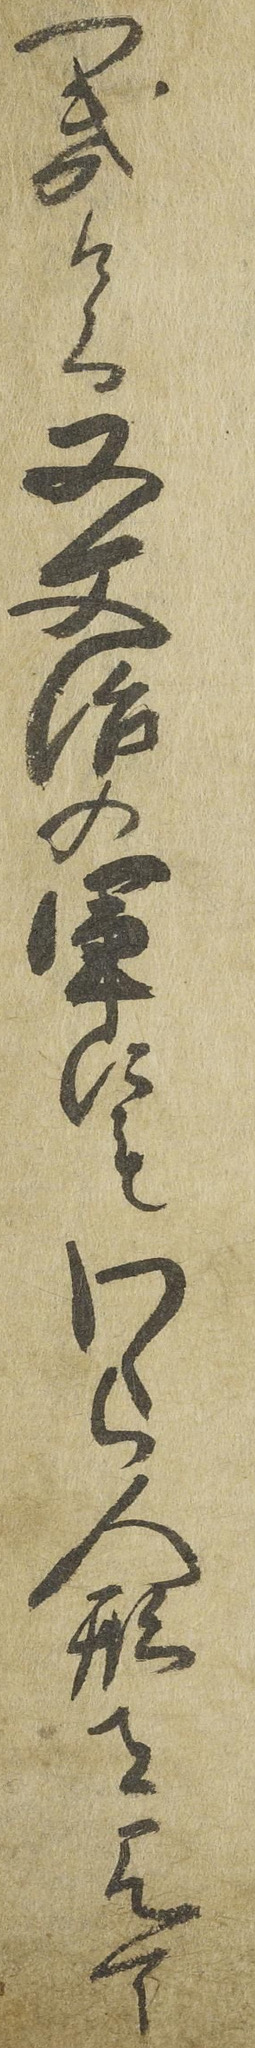つきける又文治の軍にもワら人形を見て

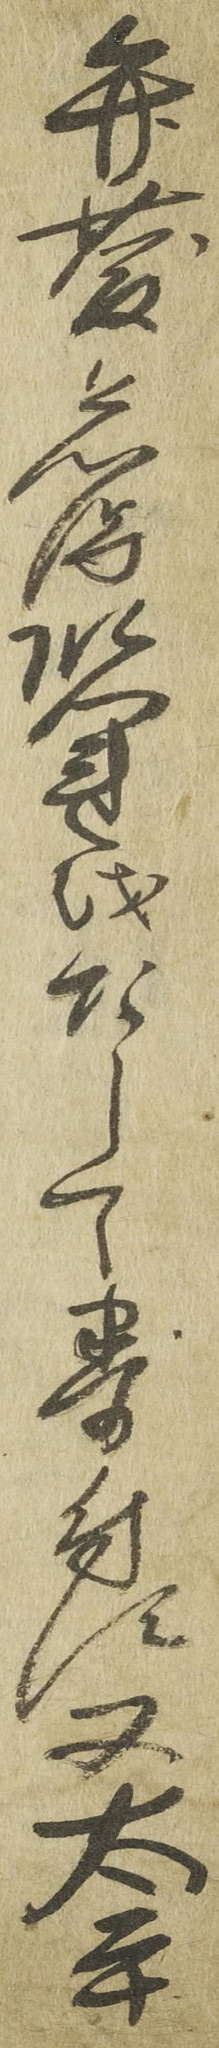弁慶と心得恐れをなして寄付す又太平
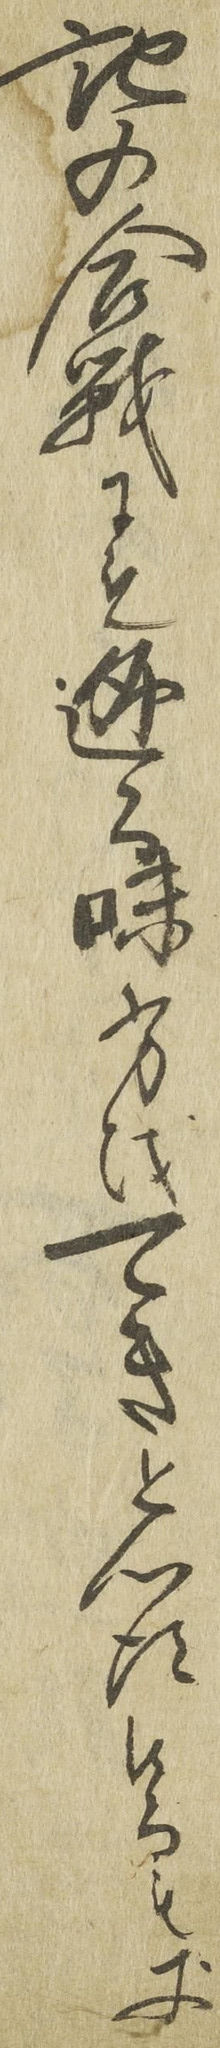記の合戦にも逃る味方をてきと心得けるもお
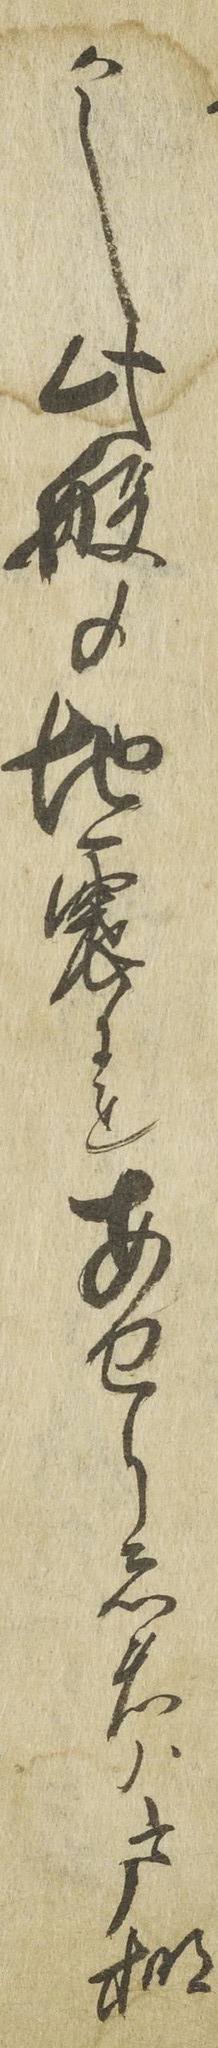かし此般の地震にもあせりし者ハ戸棚
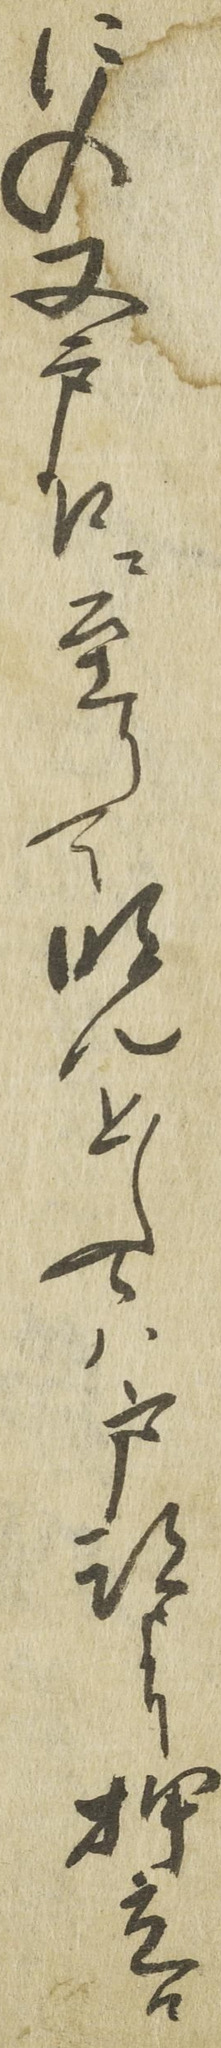に入又戸口ニ至りて明んとしてハ戸跡より押立け
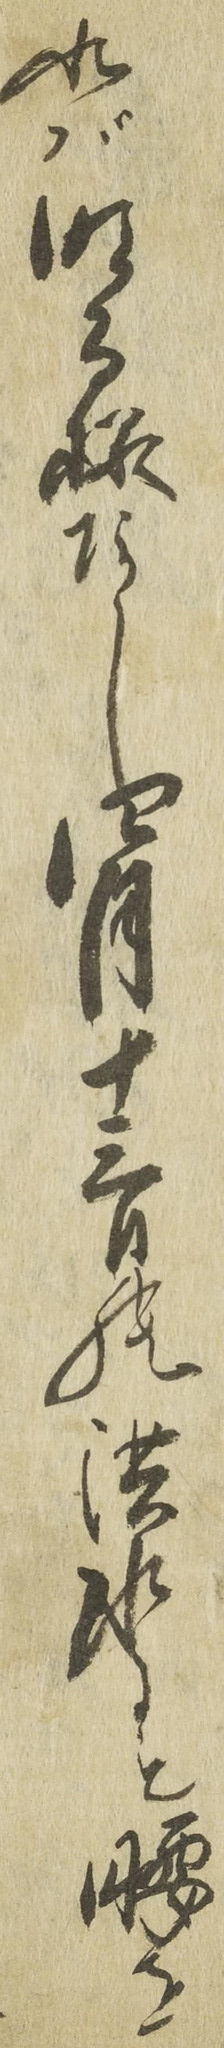れバ明る様なし四月十三日の洪水にも腰を
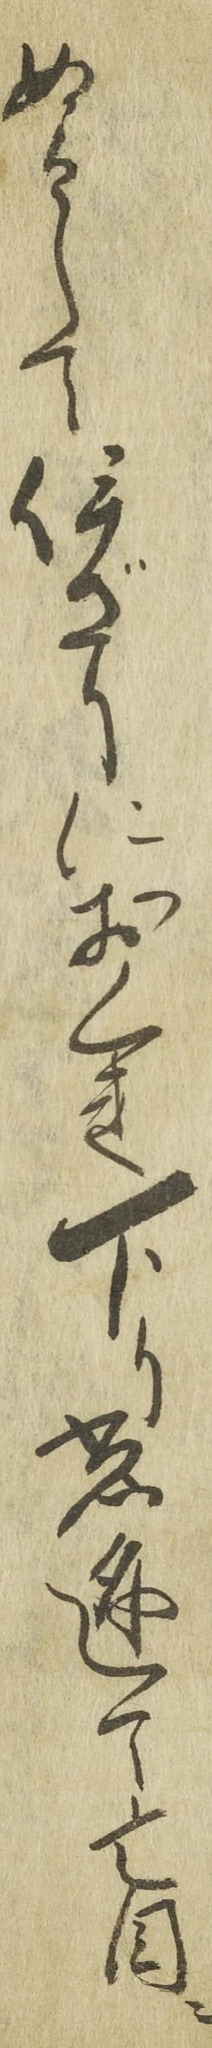ぬかしていざりにおくれ下り急逃て盲ニ
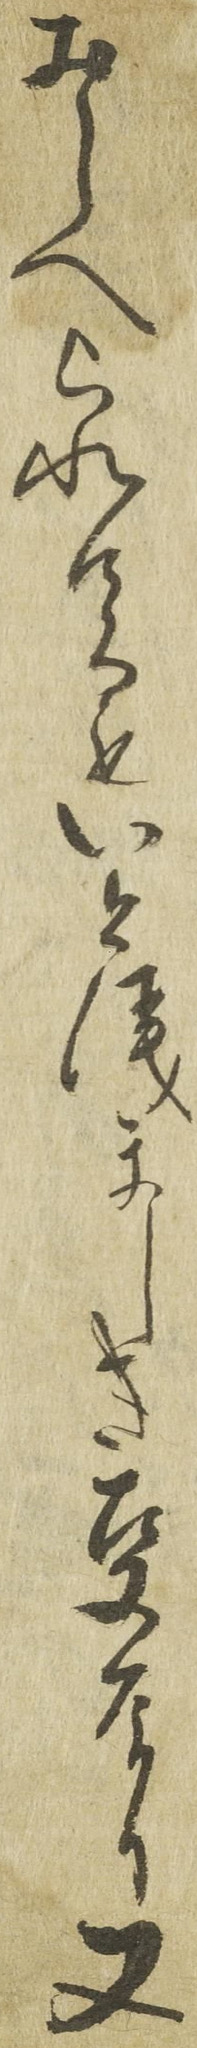おしへられけるもいと浅ましき事なり又
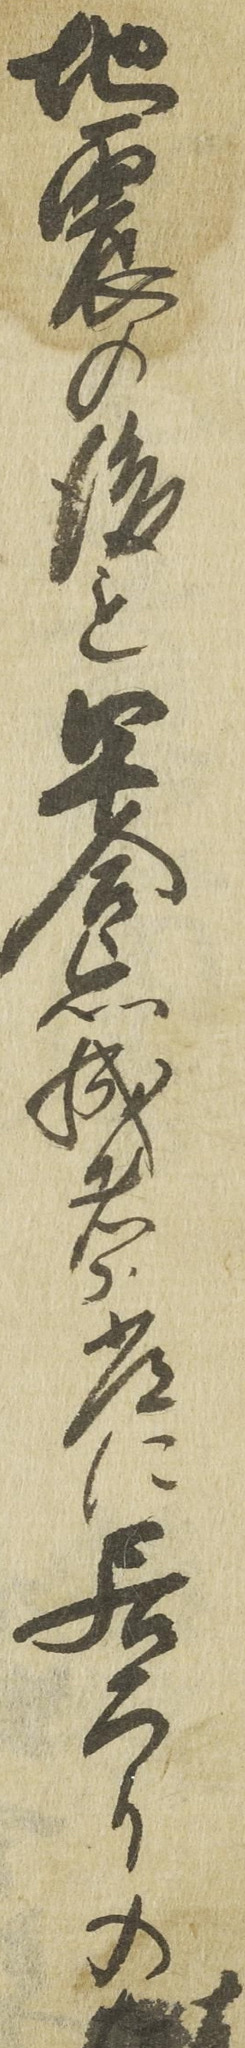地震の後も早合点成者ハ常に居ろりのは
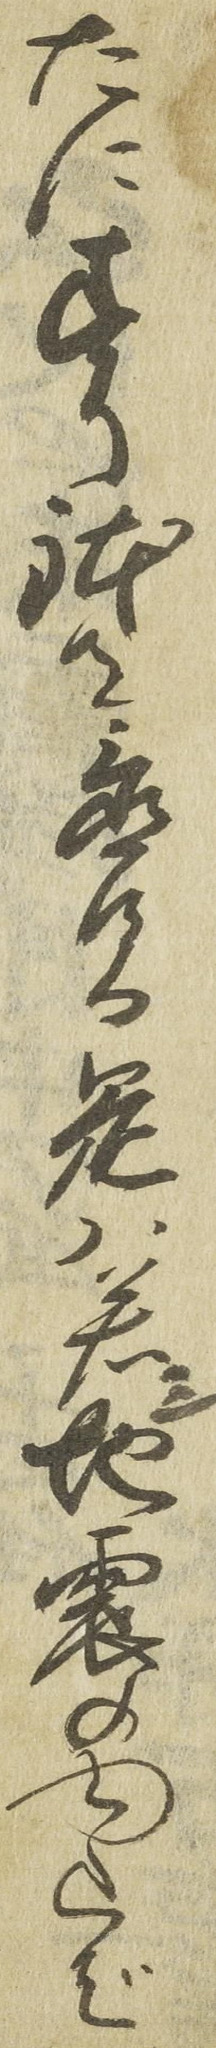たにすり鉢を置ける是ハ若シ地震の内ゆらば
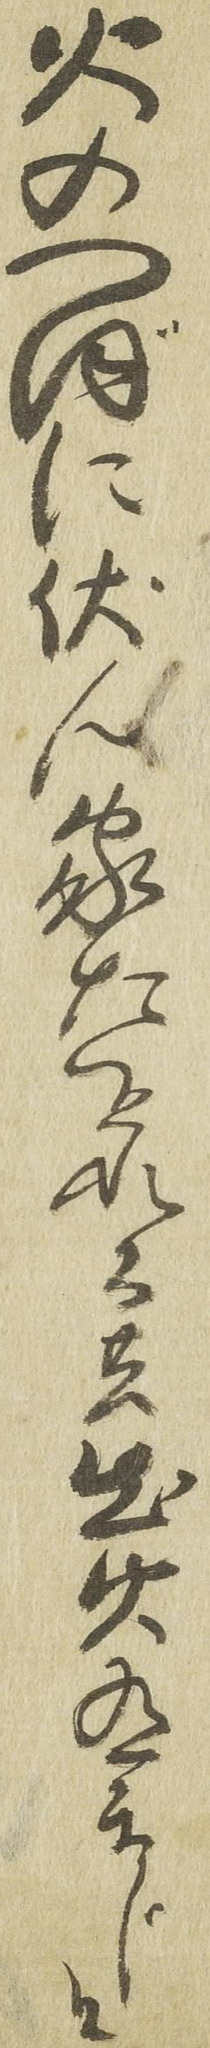火のつぼに伏ん家たをれる共出火有まじと
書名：善光寺地震聞書
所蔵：東京大学地震研究所図書室 Earthquake Research Institute Library, The University of Tokyo, JAPAN
